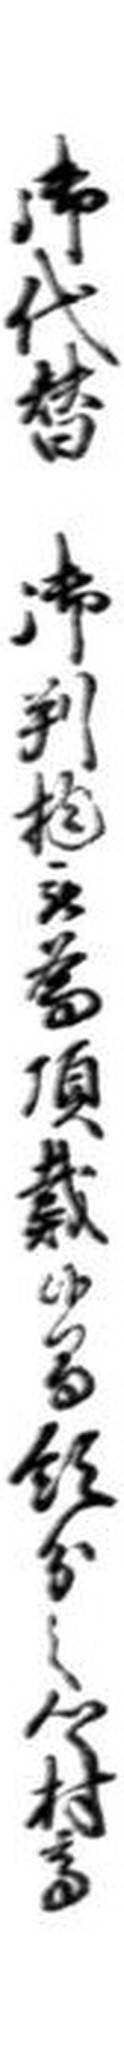御代替御判物被為頂戴候間領分之郷村高
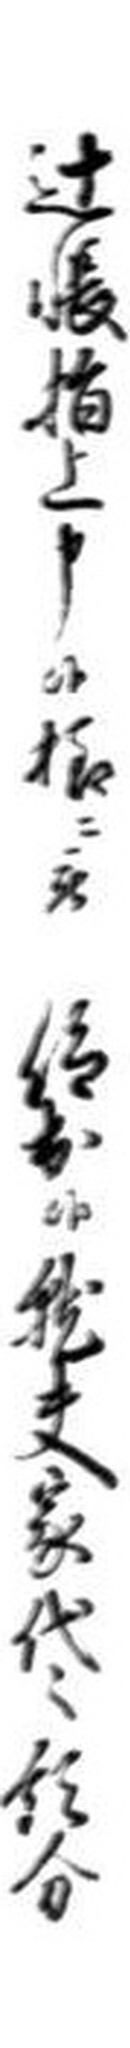辻帳指上申候様ニ被仰出候就夫家代々領分
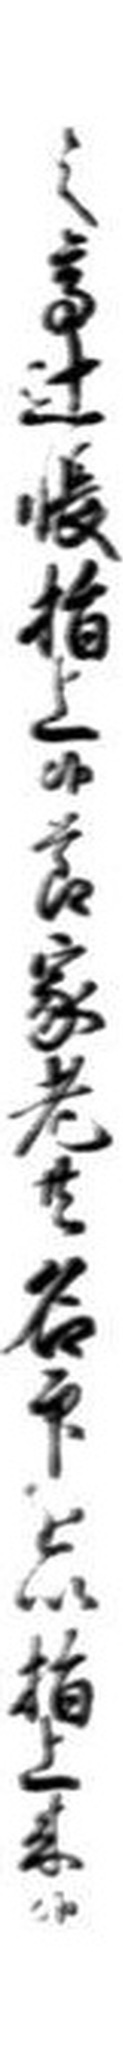之高辻帳指上候節家老共名印を以指上来候
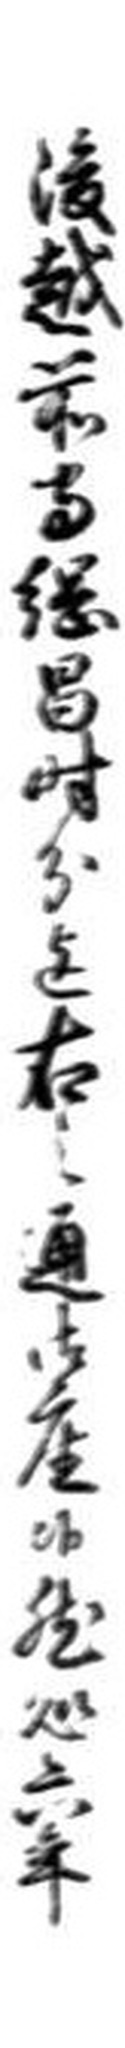後越前守綱昌時分迄右之通御座候然処六年
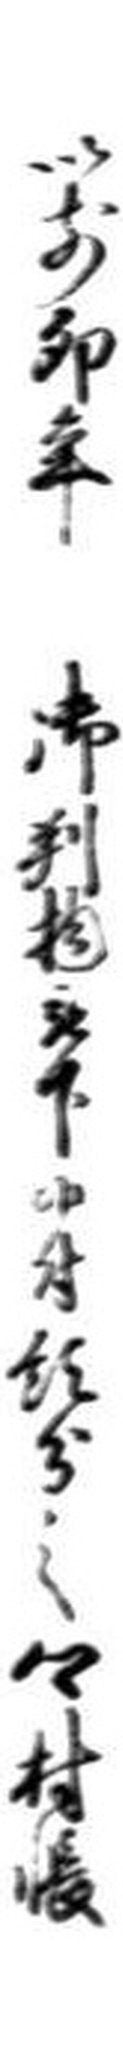以前卯年御判物被下候付領分之郷村帳
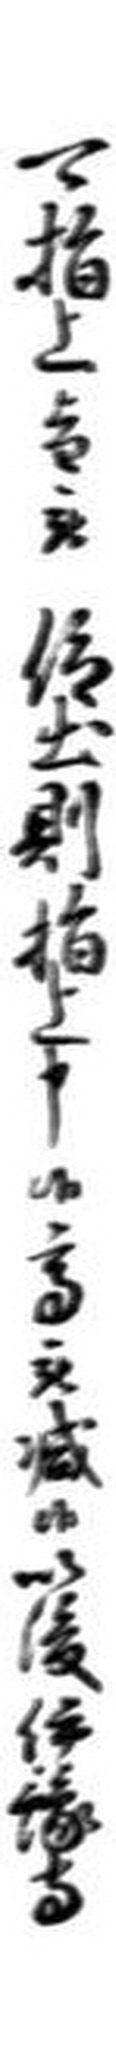可指上旨被仰出則指上申候高被減候以後伊予守
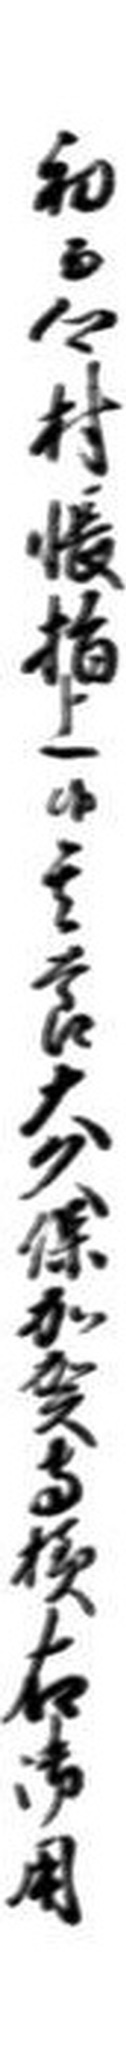初而郷村帳指上候其節大久保加賀守様右御用
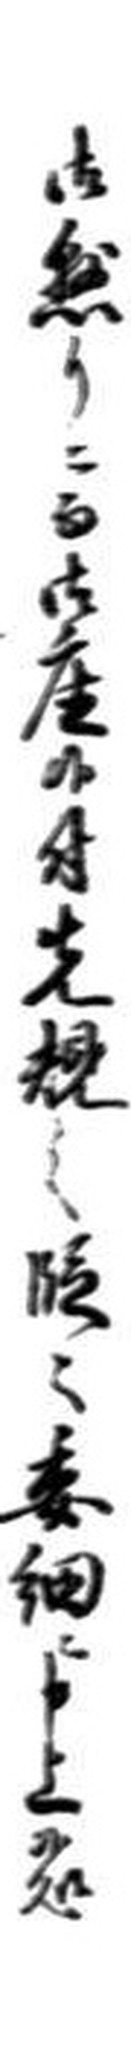御懸りニ而御座候付先規之段々委細ニ申上候処
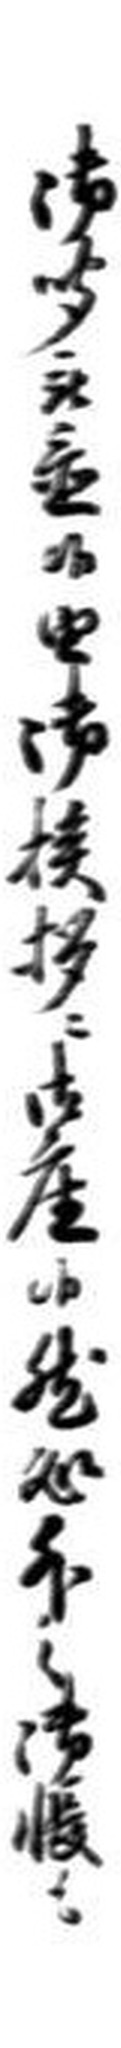御聞被置候由御挨拶ニ御座候然処外之御帳も
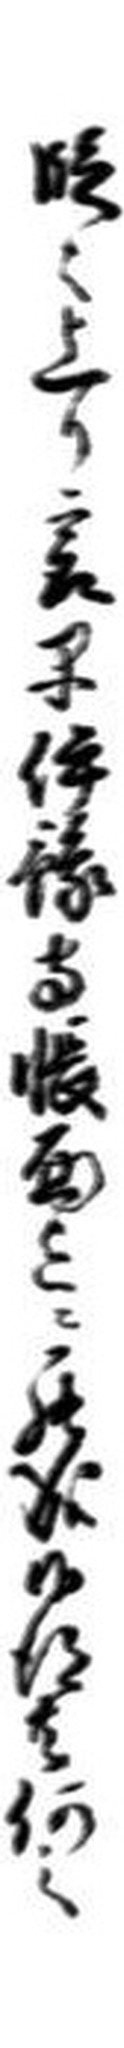段々上り最早伊予守帳面迄ニ罷成候得共何之

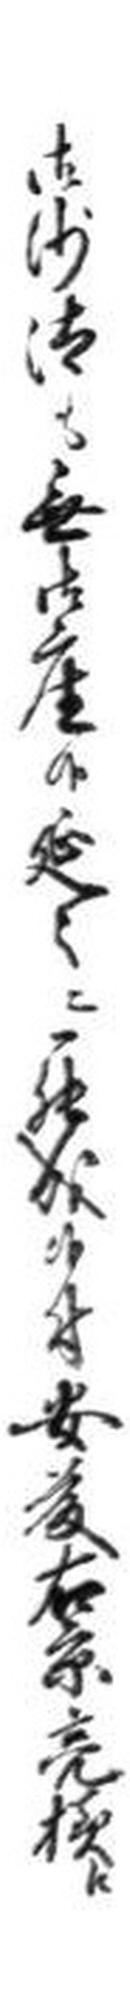御沙汰も無御座候延々ニ罷成候付安藤右京亮様江
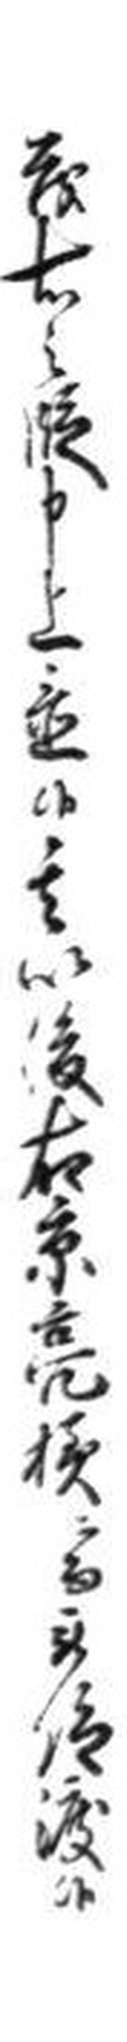も右之段申上置候其以後右京亮様ニ而被仰渡候
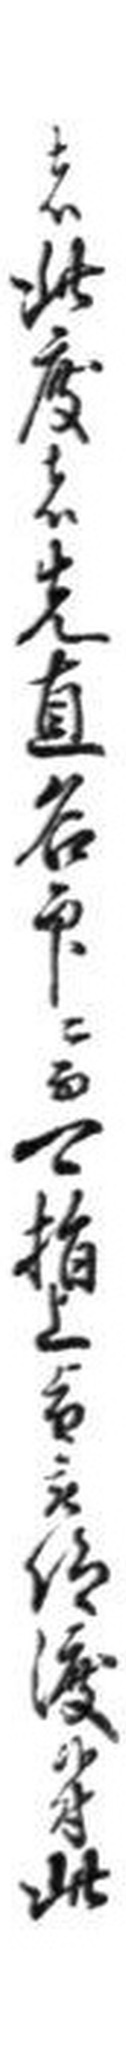者此度者先直名印ニ而可指上旨被仰渡候付此
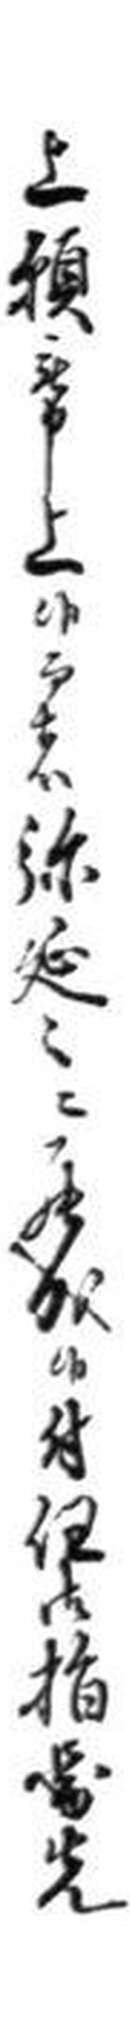上願被申上候而者弥延々ニ罷成候付任御指図先
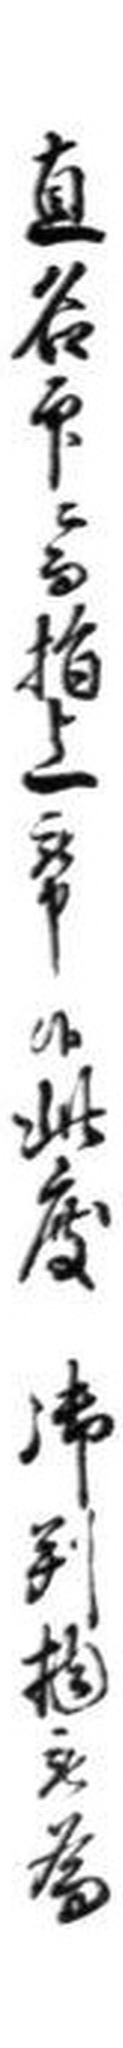直名印ニ而指上被申候此度御判物被為
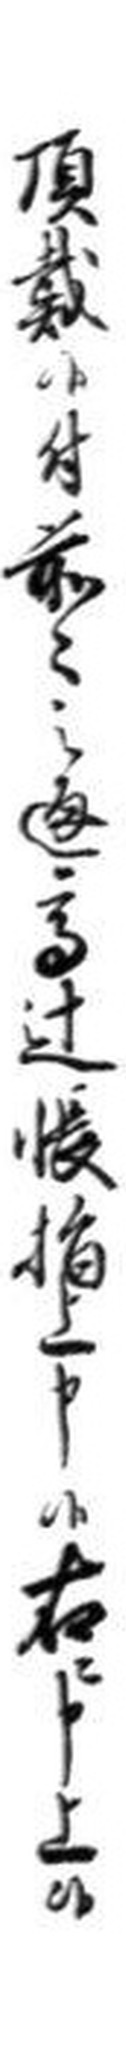頂戴候付前々之通高辻帳指上申候右ニ申上候
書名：家譜 三十一 吉邦公 享保元年
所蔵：福井県文書館 Fukui Prefectural Archives
